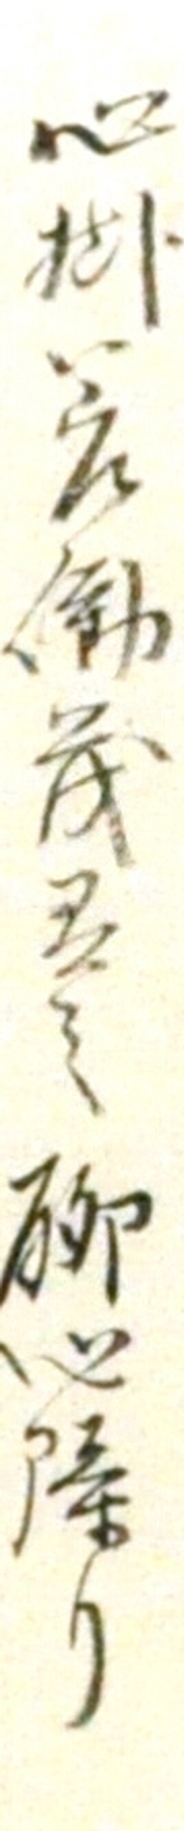心掛差働有之聊心障り
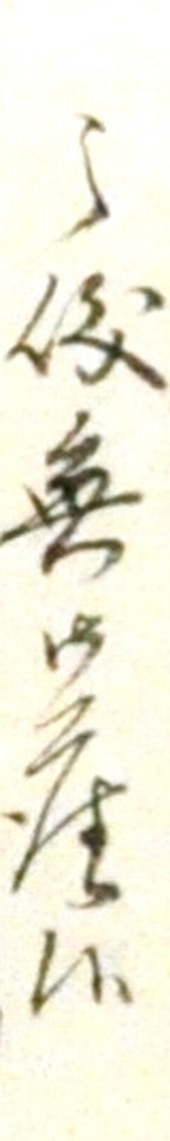之儀無御座候
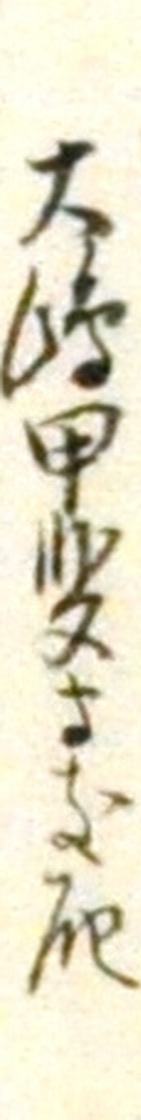大崎甲斐守支配
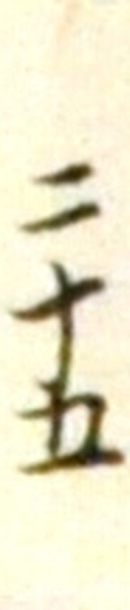二十五
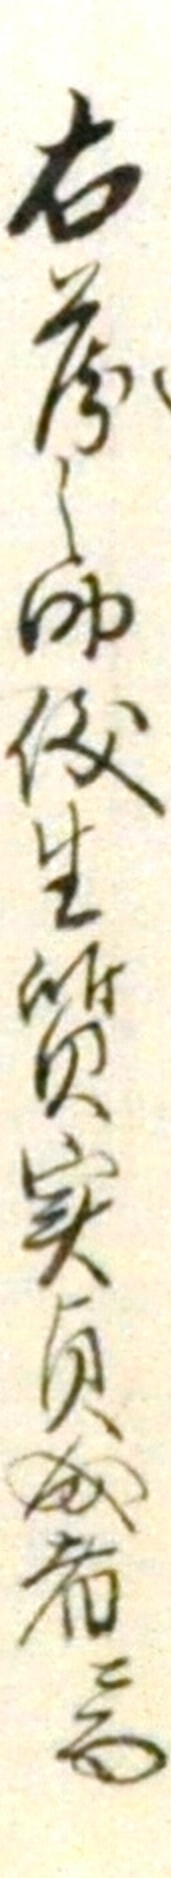右蔵之助儀生質実貞成者ニ而
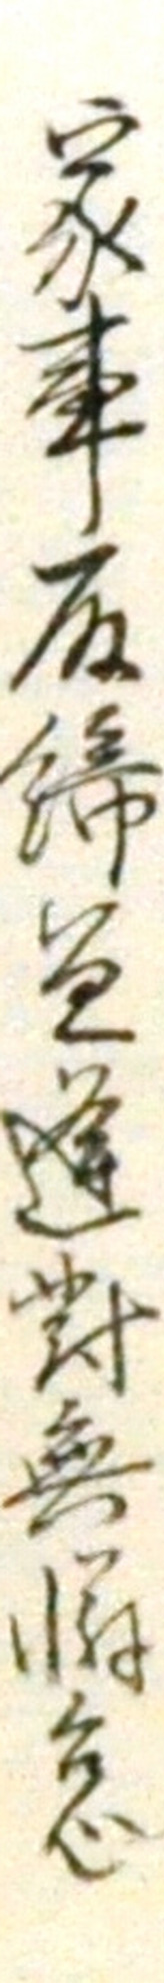家事取締宜逢対無懈怠
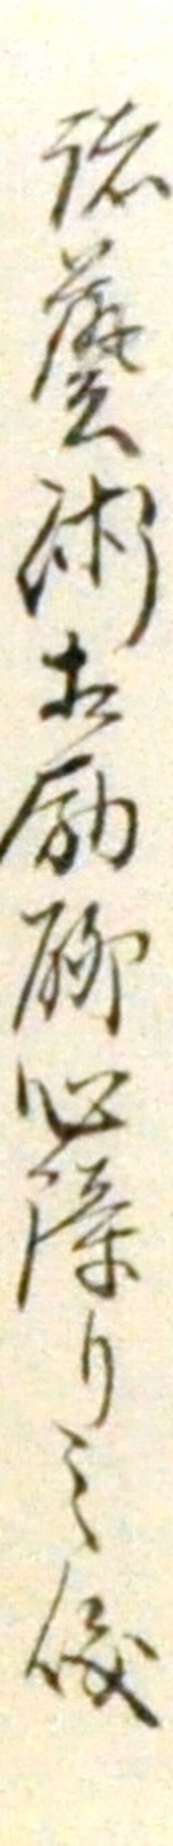諸芸術相励聊心障り之儀
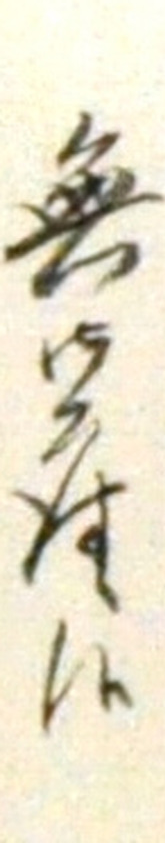無御座候

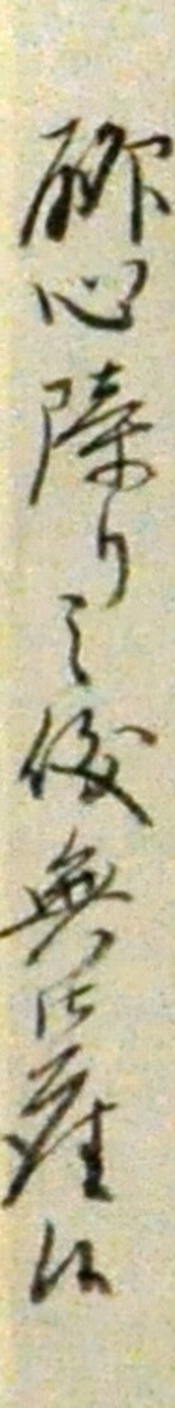怠聊心障り之儀無御座候
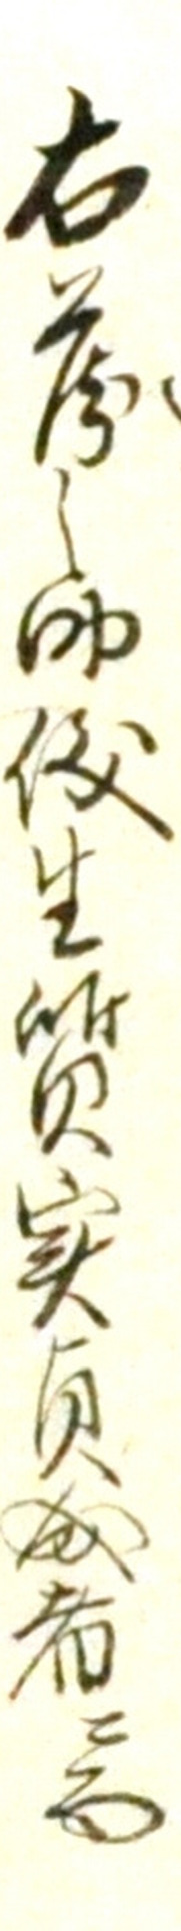右長十郎儀生質実貞成者ニ而
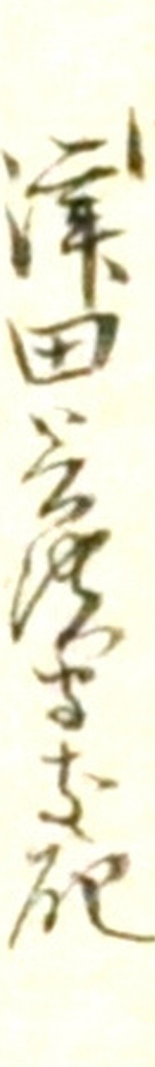津田美濃守支配
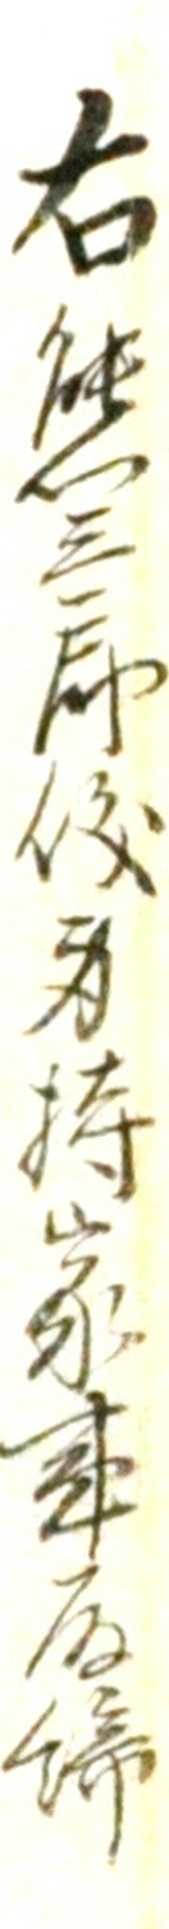右熊三郎儀身持家事取締
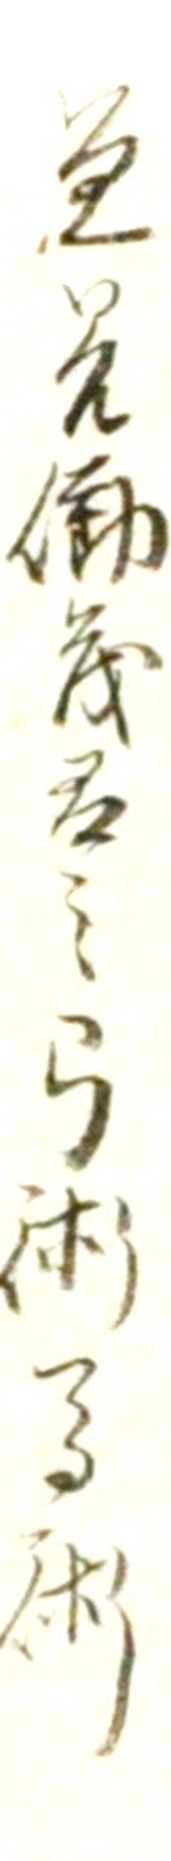宜差働も有之弓術馬術
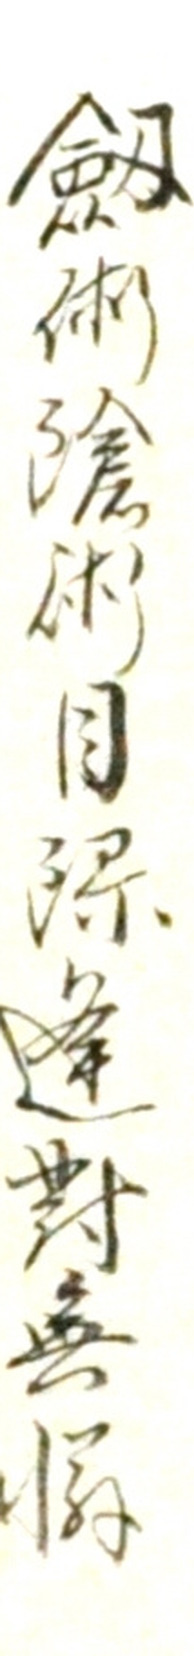剣術鎗術目録逢対無懈
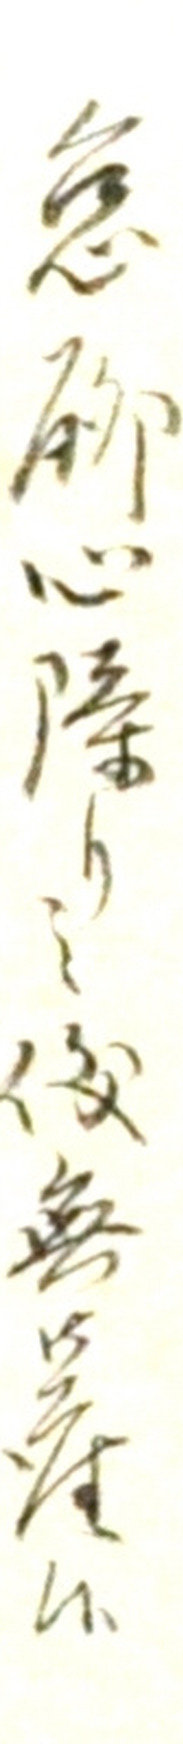怠聊心障り之儀無御座候
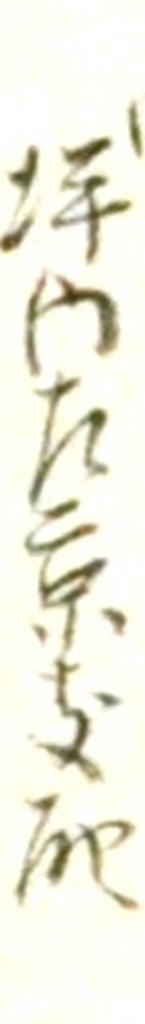坪内左京支配
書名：右大将様御書院番御入人調〔一括〕
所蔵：伊那市立高遠町図書館・合同会社AMANE
